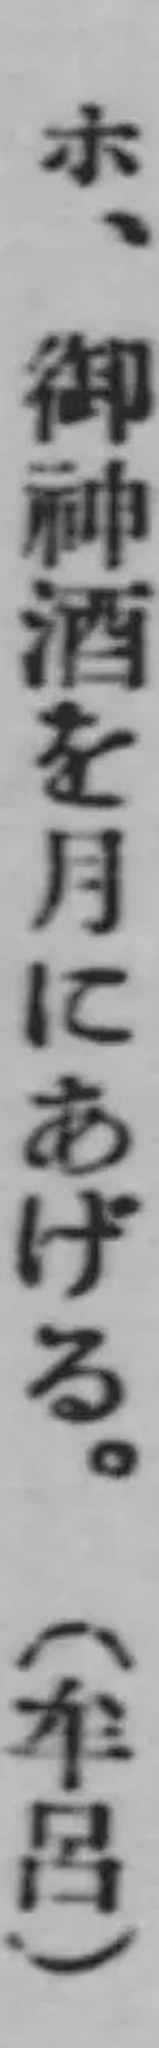ホ、御神酒を月にあげる。(牟呂)
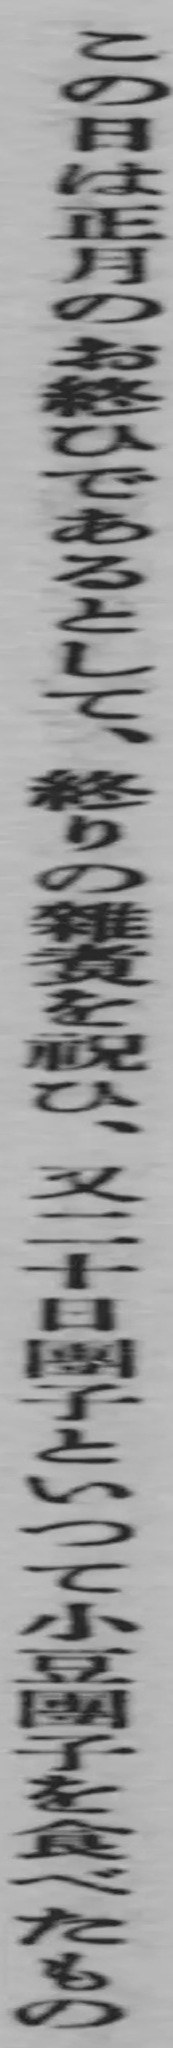この日は正月のお終ひであるとして、終りの雜煮を祝ひ、又二十日團子といつて小豆團子を食べたもの
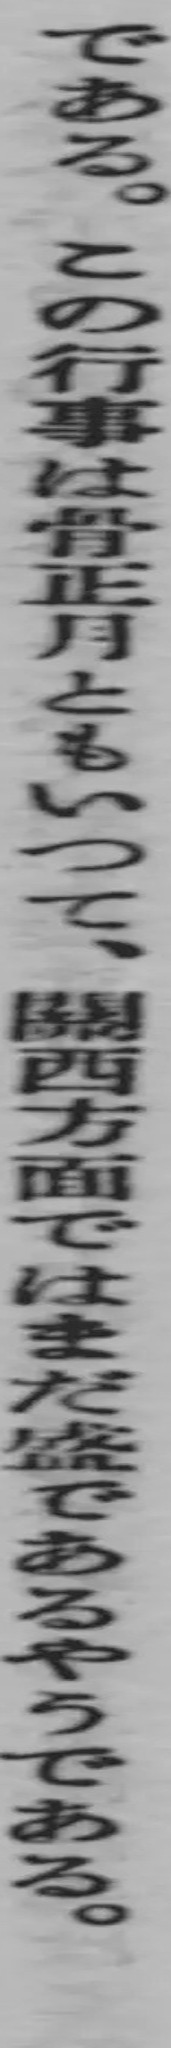である。この行事は骨正月ともいつて關西方面ではまだ盛であるやうである。
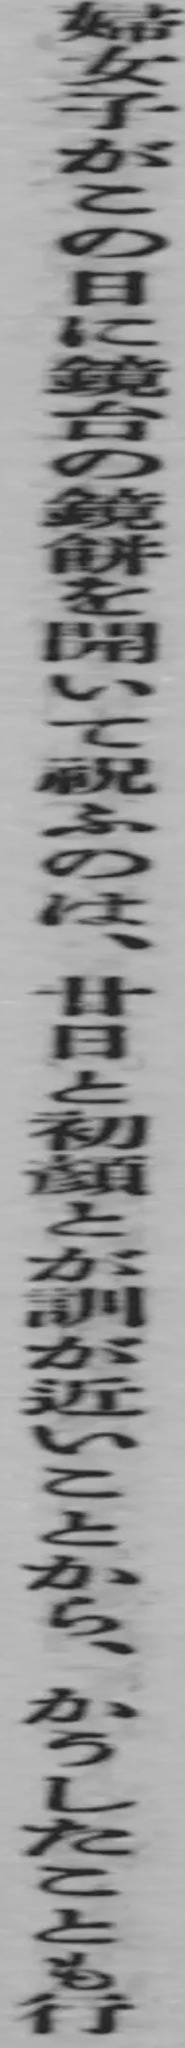婦女子がこの日に鏡台の鏡餅を開いて祝ふのは、廿日と初顏とが訓が近いことから、かうしたことも行
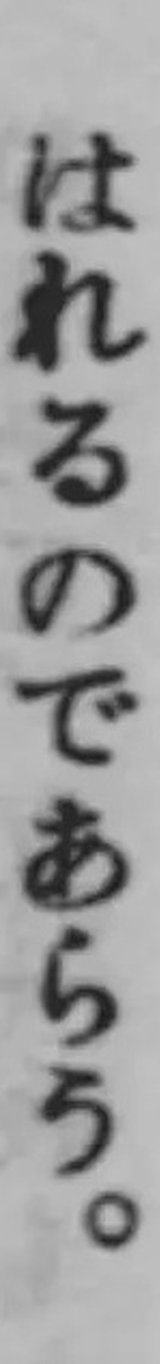はれるのであらう。
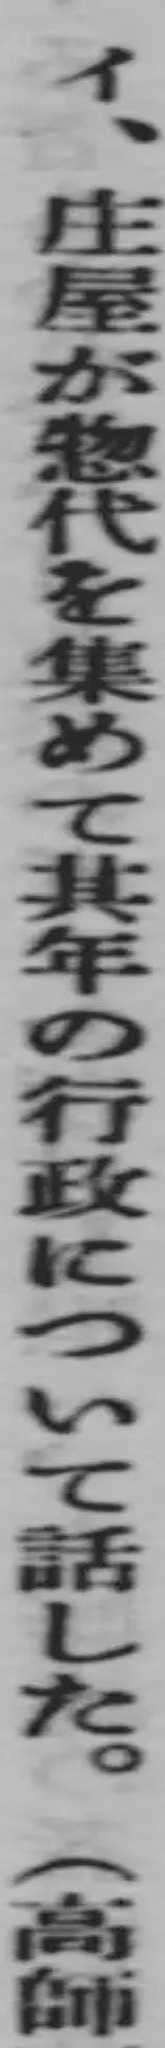イ、庄屋が惣代を集めて其年の行政について話した。(高師)
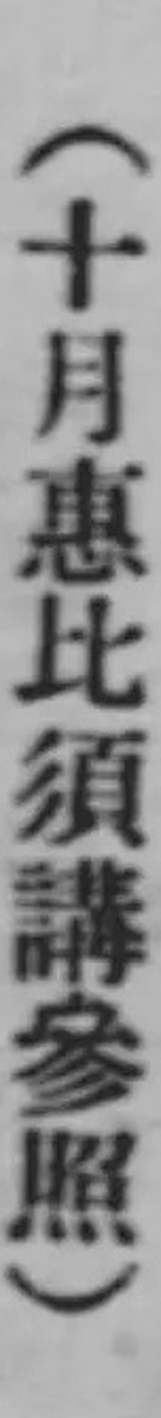(十月惠比須講參照)
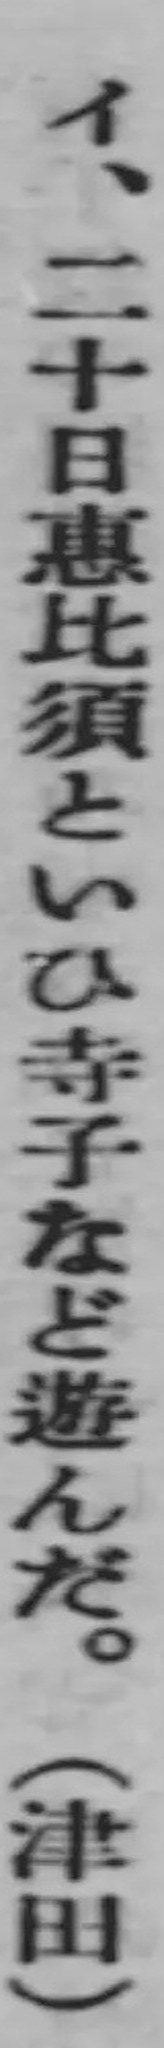イ、二十日惠比須といひ寺子など遊んだ。(津田)
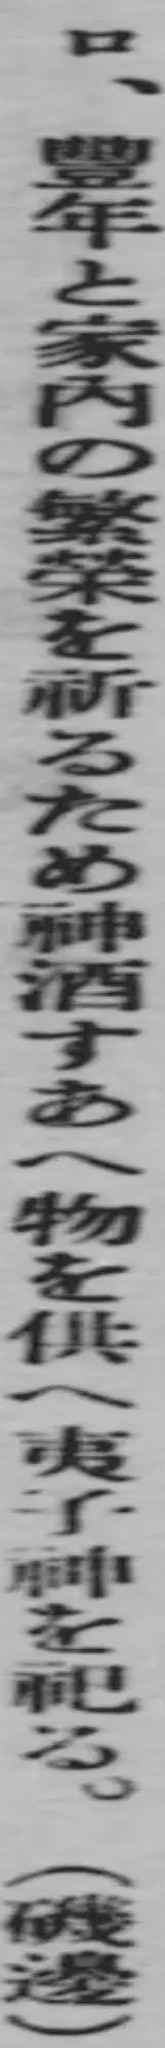ロ、豐年と家内の繁榮を祈るため神酒すあへ物を供へ夷子神を祀る。(磯邊)
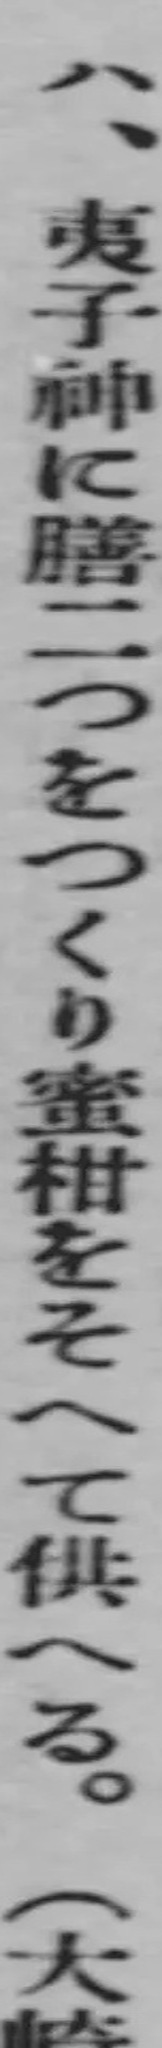ハ、夷子神に膳二つをつくり蜜柑をそへて供へる。(大崎)
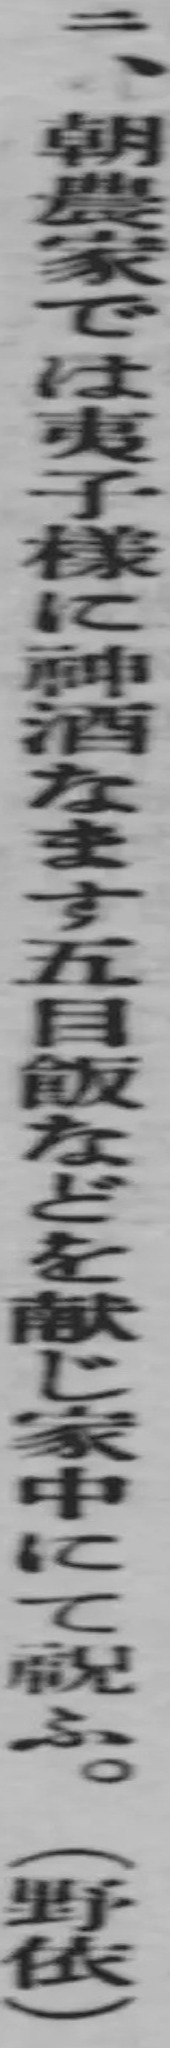ニ、朝農家では夷子様に神酒なます五目飯などを献じ家中にて祝ふ。(野依)
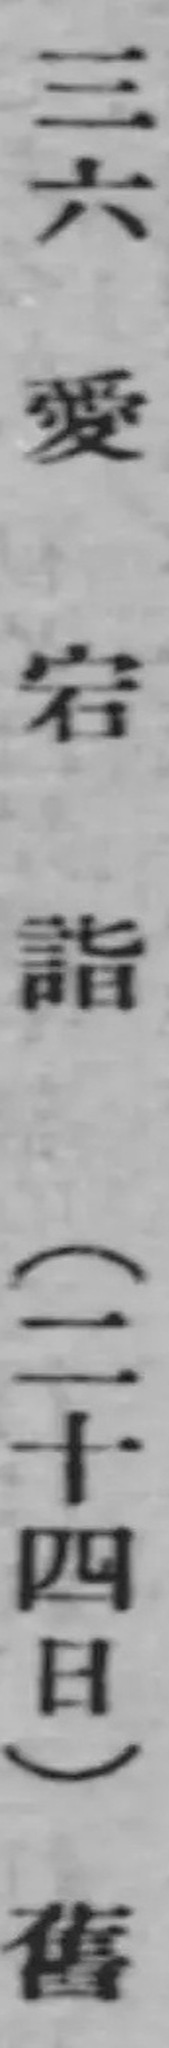三六愛宕詣(二十四日)舊
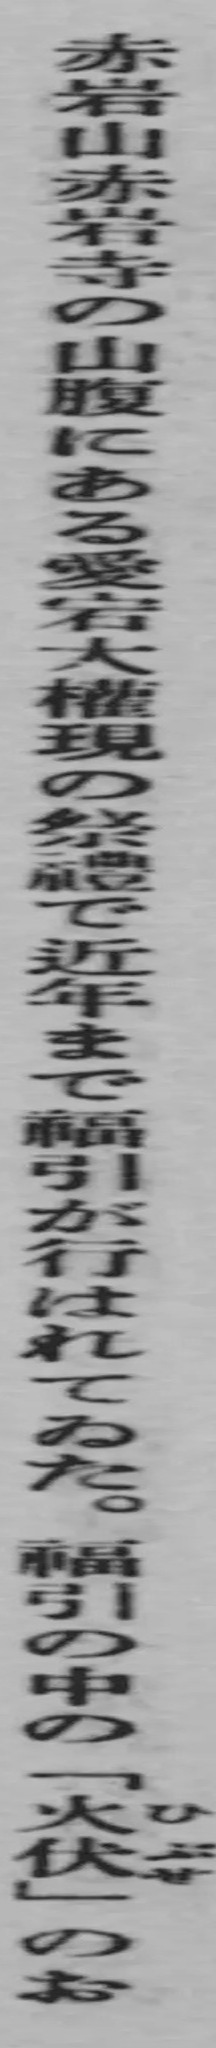赤岩山赤岩寺の山腹にある愛宕大權現の祭禮で近年まで福引が行はれてゐた。福引の中の「火伏」のお
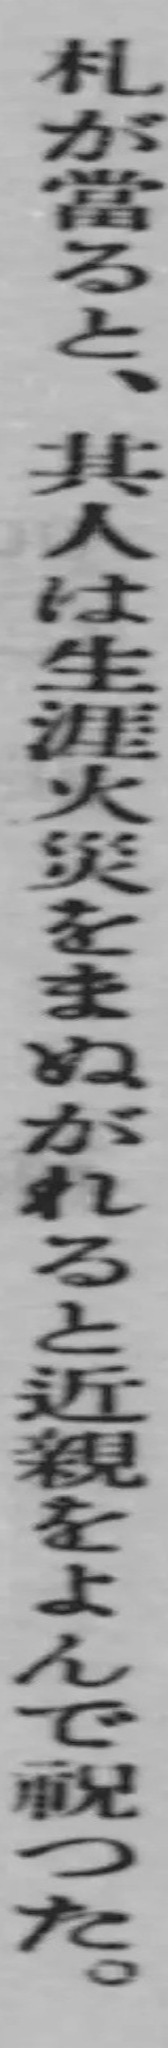札が當ると、其人は生涯火災をまぬがれると近親をよんで祝つた。
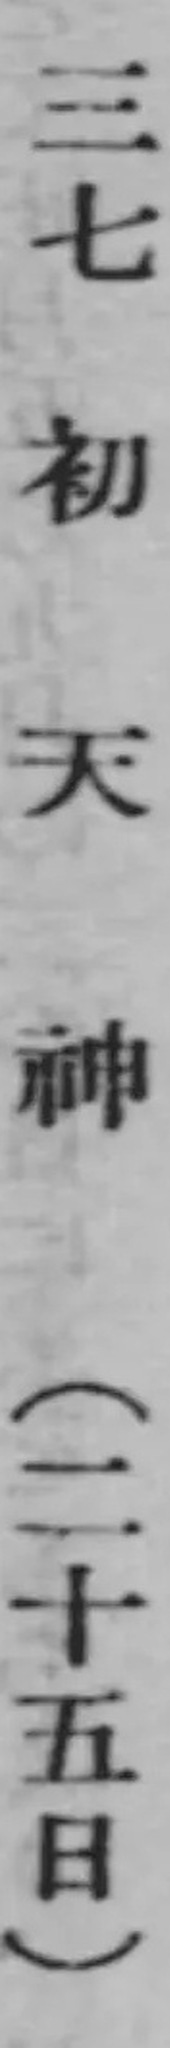三七初天神(二十五日)
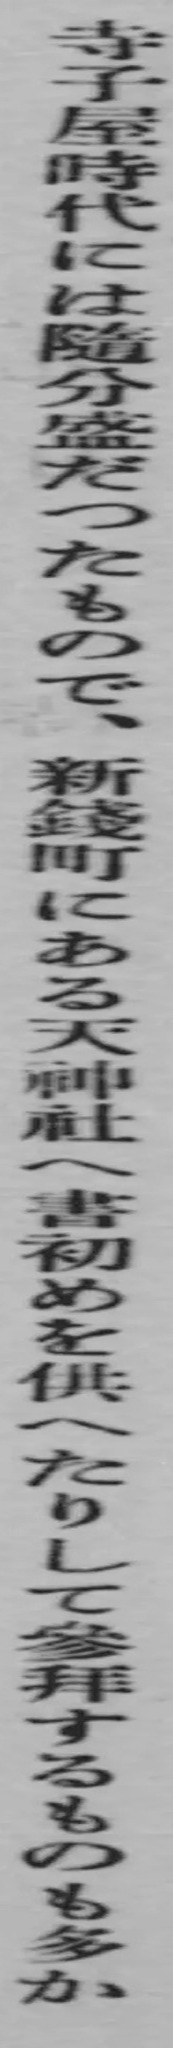寺子屋時代には随分盛だつたもので、新錢町にある天神社へ書初めを供へたりして參拜するものも多か
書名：豊橋の年中行事
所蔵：国立国会図書館 National Diet Library, JAPAN
